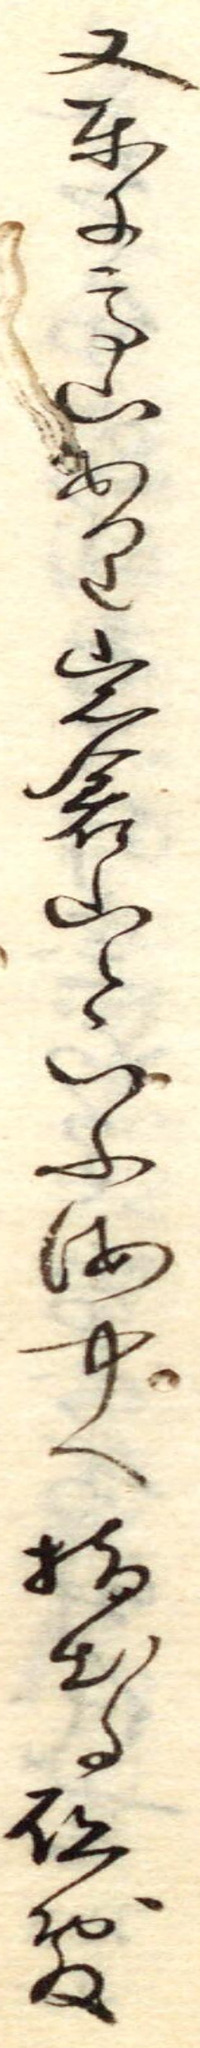又東に高山あり岩倉山といふ海中へ指出る敷
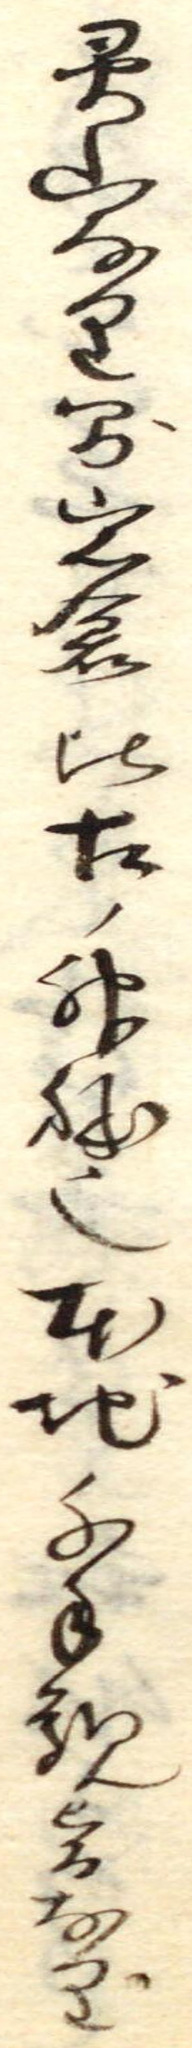霊山なり則岩倉比古ノ神也本地千手観音なり
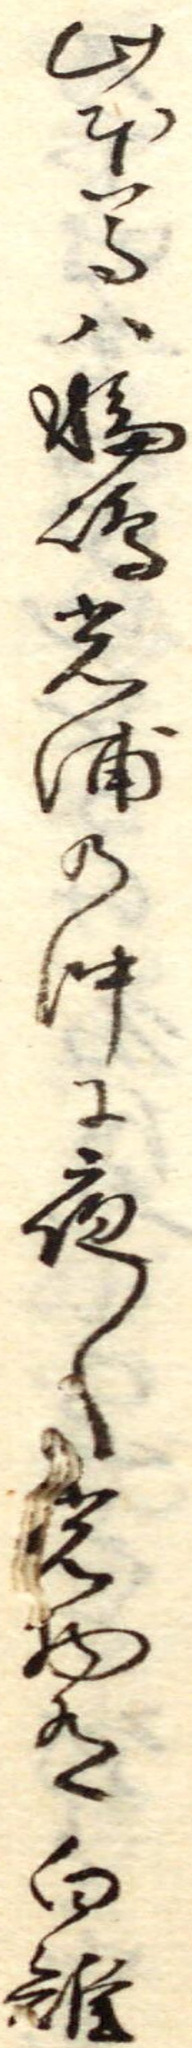此本尊は輪嶋光浦の沖に夜々光物有白雉
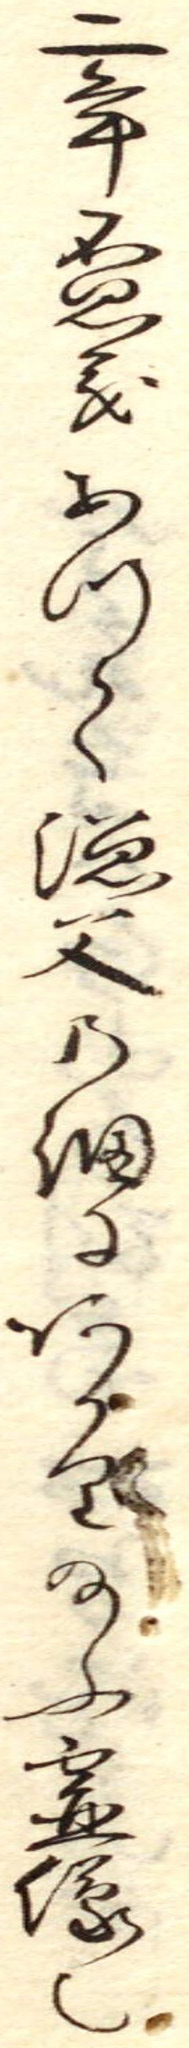二年不思義あつて漁父の網にあかり給ふ霊像也
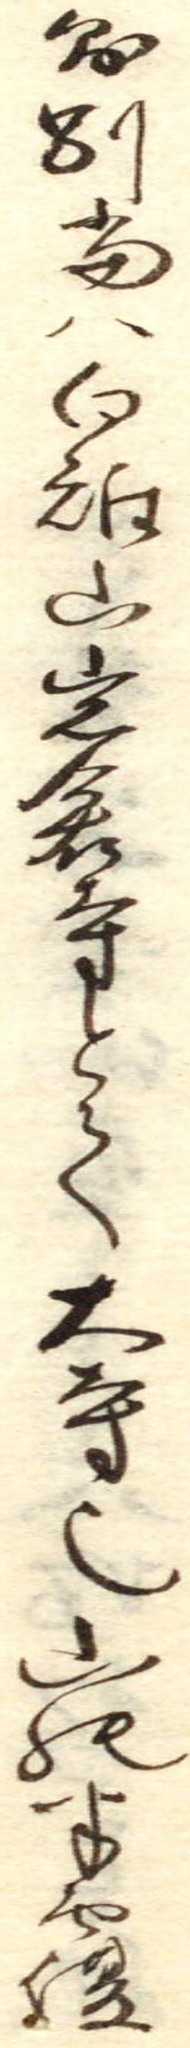則別当は白雉山岩倉寺とて大寺也山の半覆
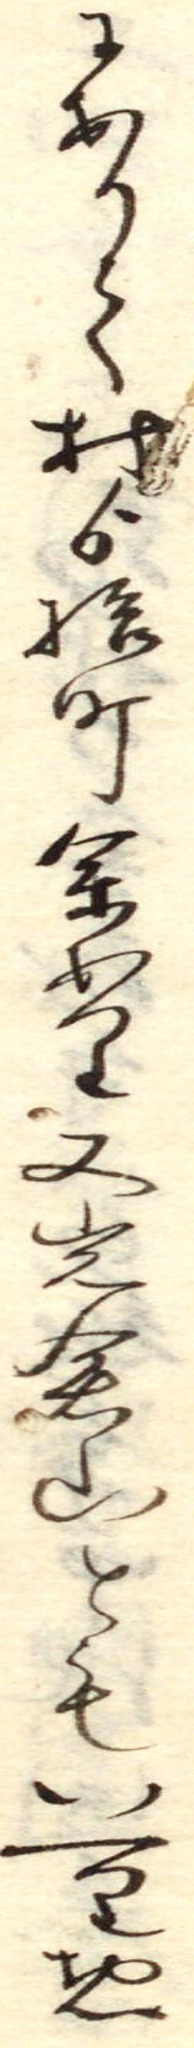にありて村ゟ拾町余あり又岩倉山ともいへり惣
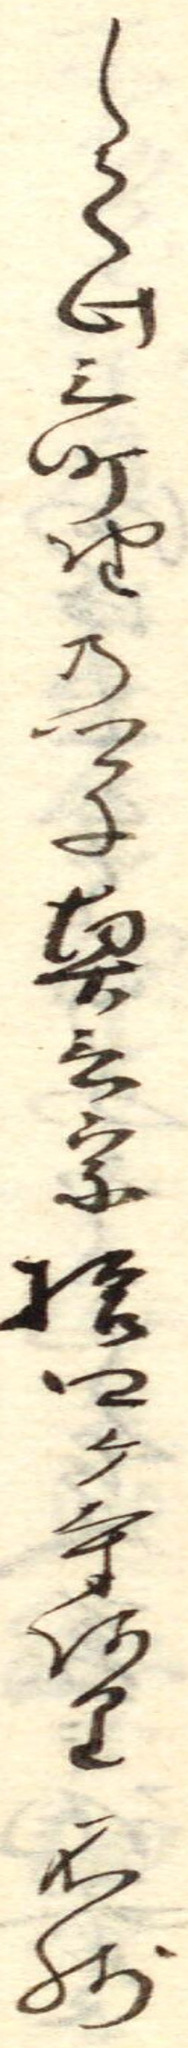して上町野の郷に真言宗拾四ヶ寺あり不残
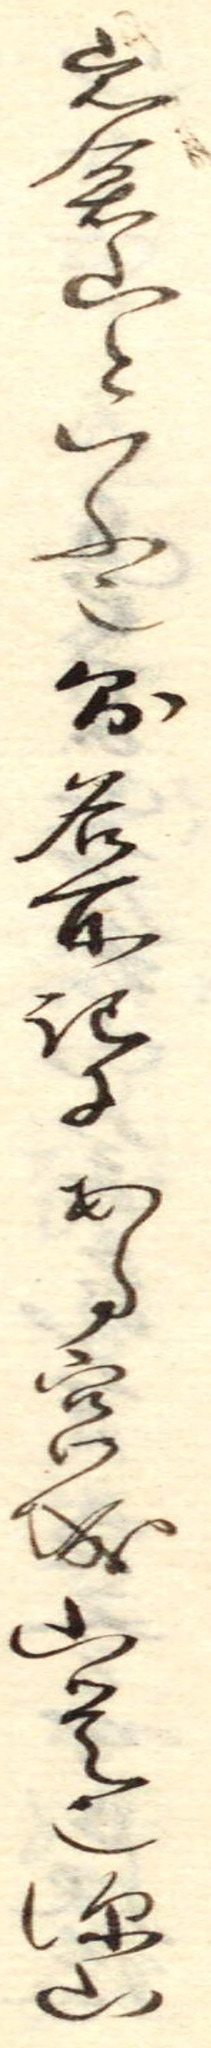岩倉山といふ也則各所記にある宮城山是也深山
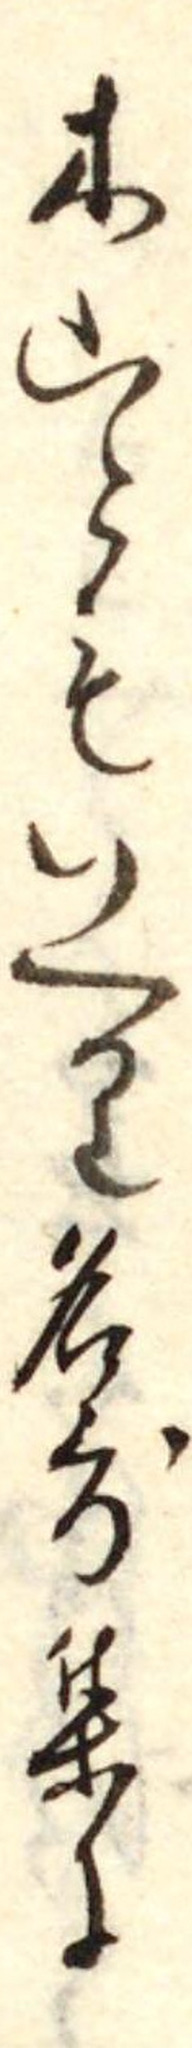木山ともいへり名哥集に
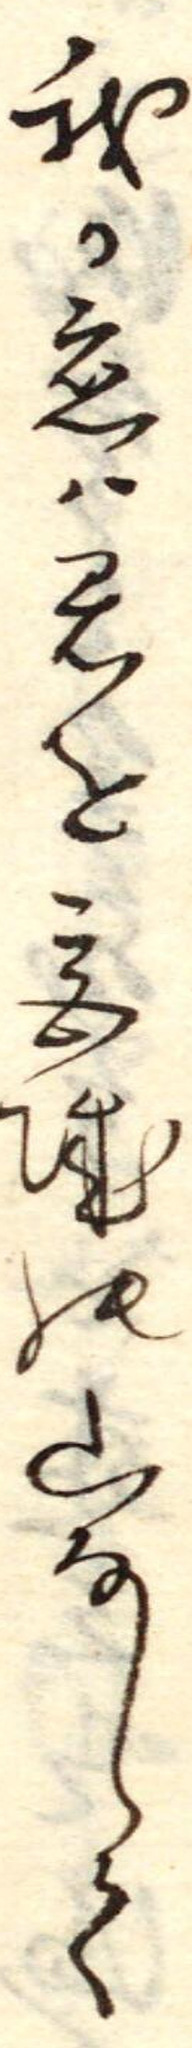我か恋は君を宮城の山ならて
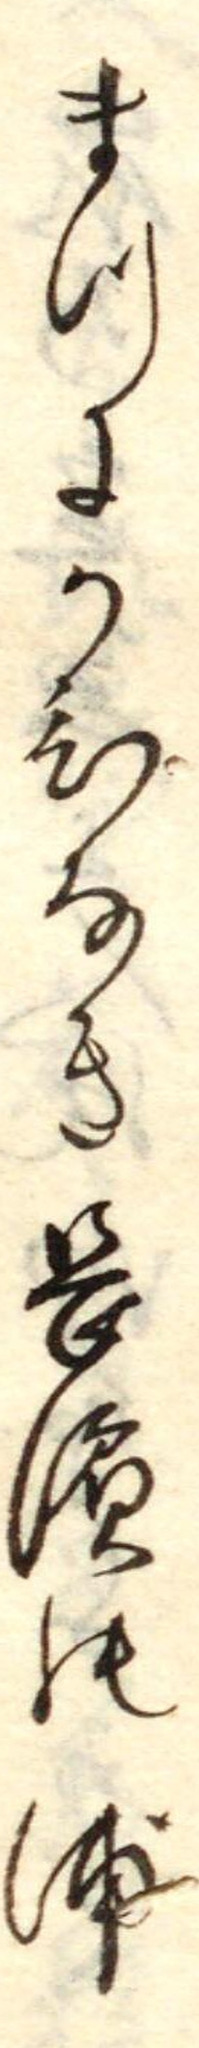まつにかひなき長浜の浦
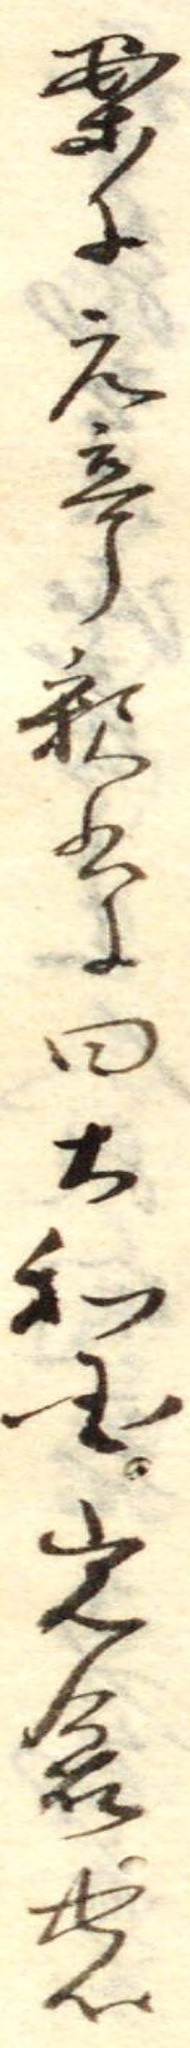案に元亨釈書に曰大和国岩倉の

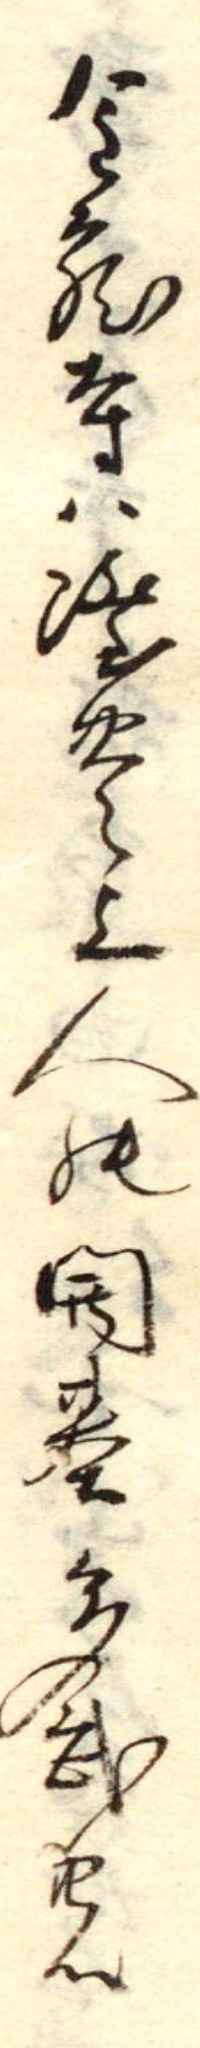金蔵寺は澄豊上人の開基多武の
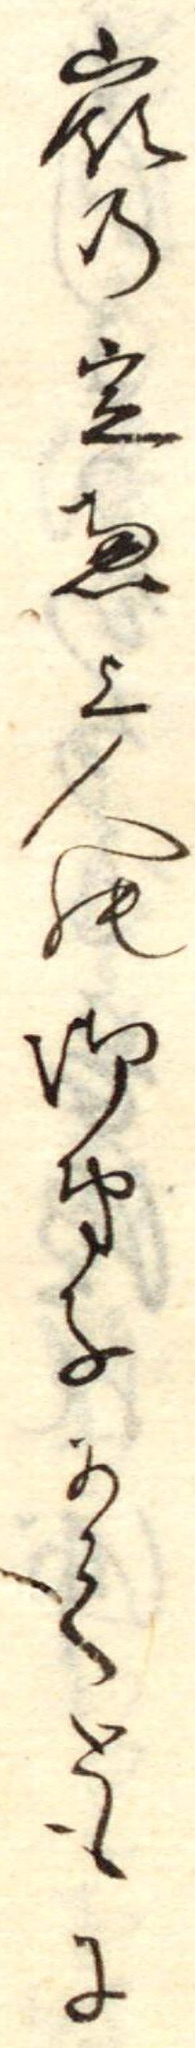嶺の定恵上人の御弟子にてともに
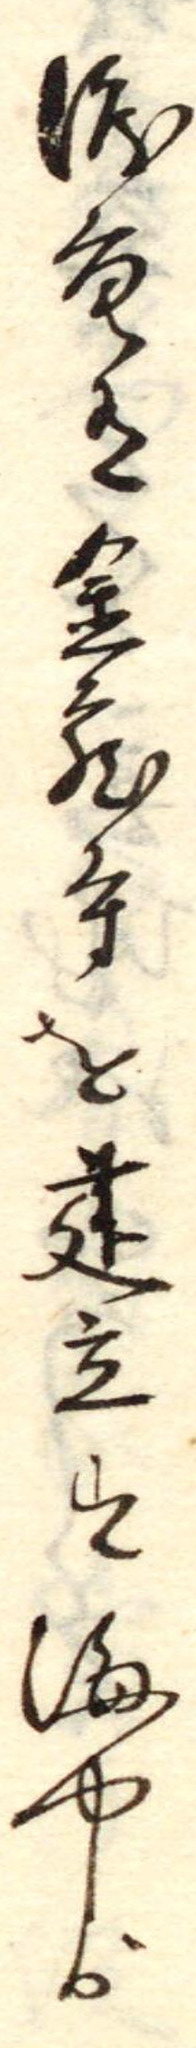渡唐有金蔵寺を建立す海中ゟ
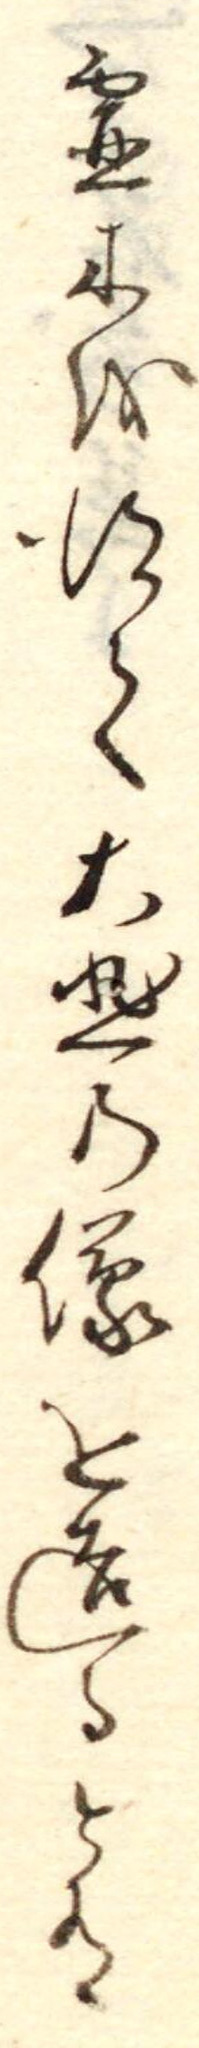霊木を得て大悲の像を造ると有
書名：能登名跡誌
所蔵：Ishikawa Prefectural Library
